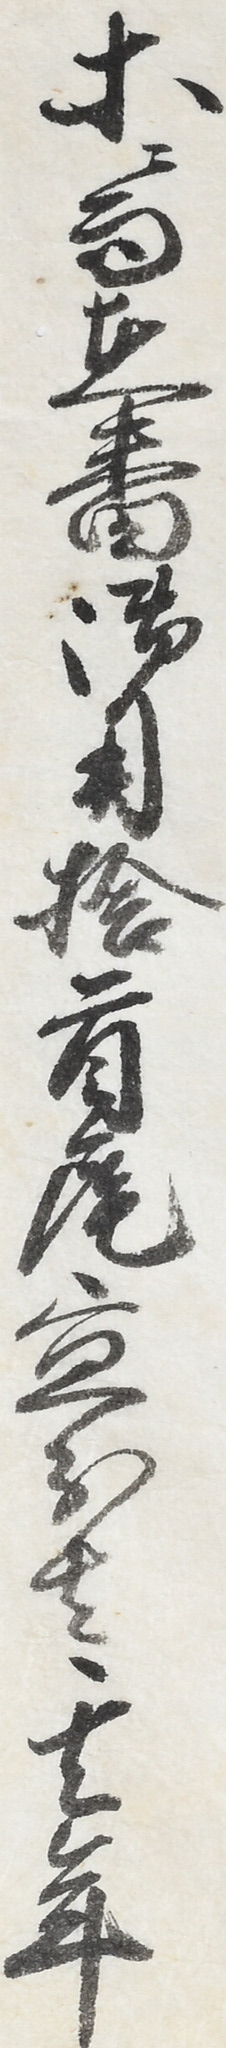等ニ而在番御用捨首尾宜分は其年

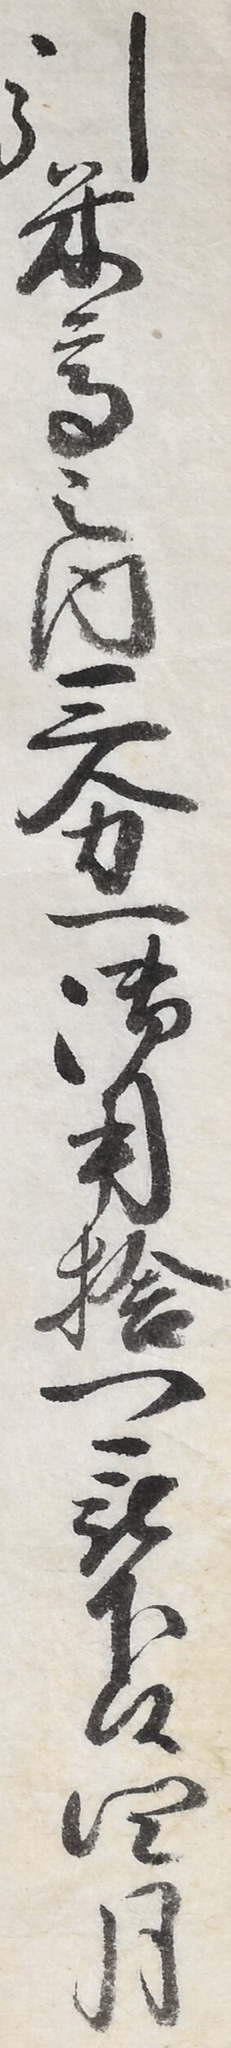引米高之内三分一御用捨可被下候四月
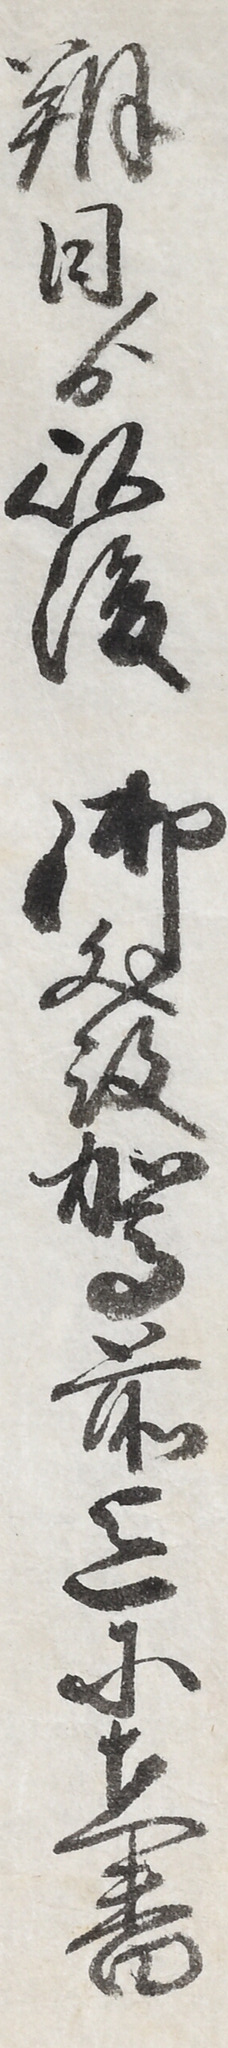朔日ゟ以後御発駕前迄に在番
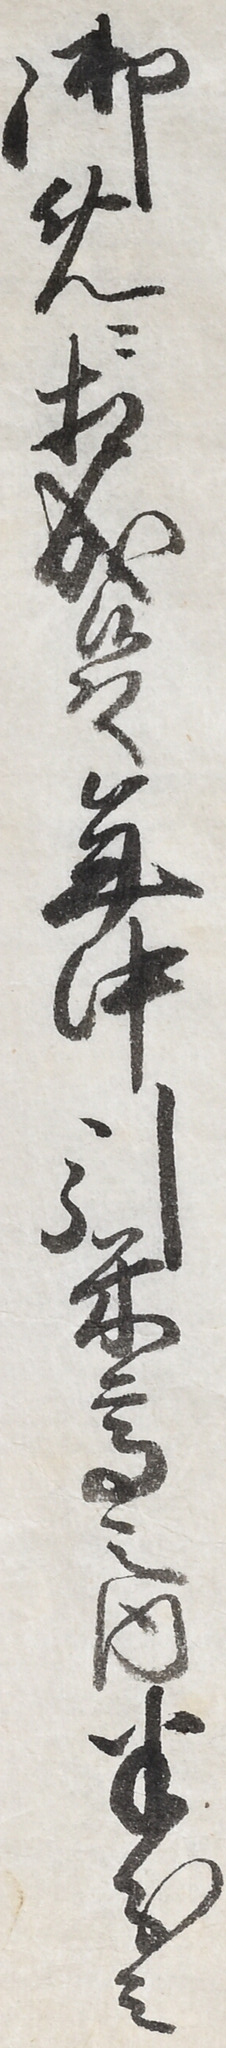御免ニ相成候ハヽ年中引米高之内半分之
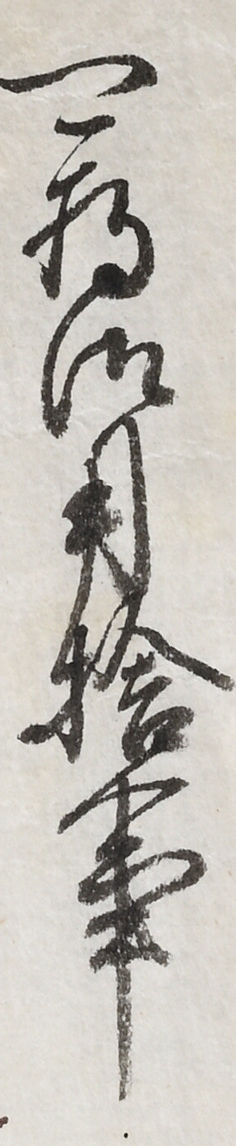可為御用捨事
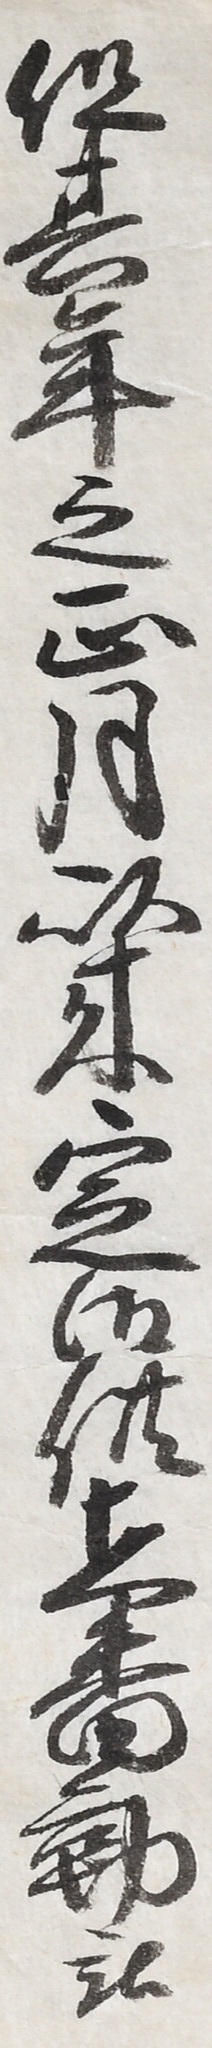但其年之正月以来定御供在番勤被
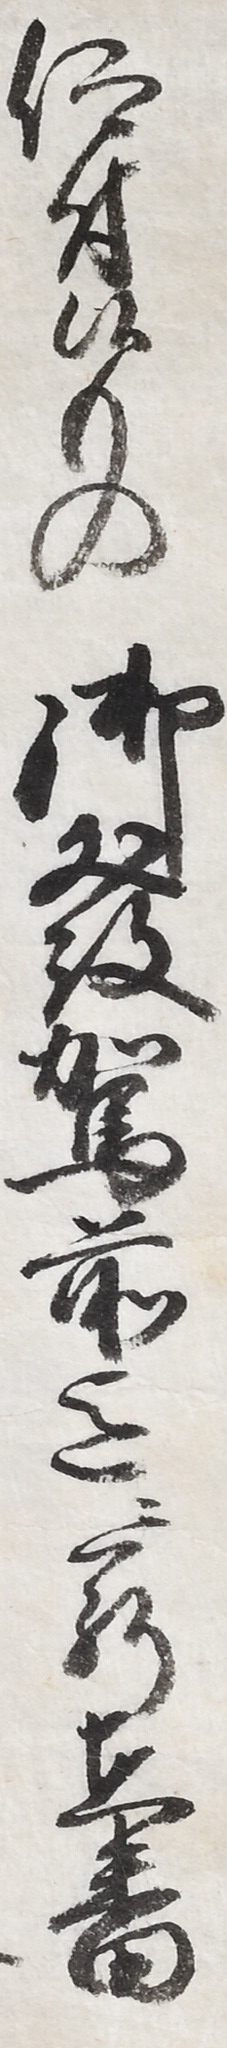仰付候もの御発駕前迄ニ若在番
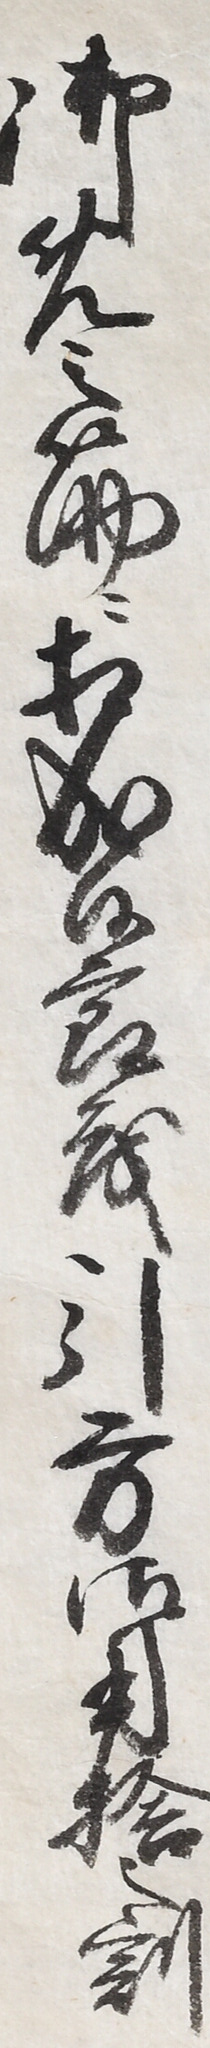御免之筋ニ相成候節も引方御用捨之割
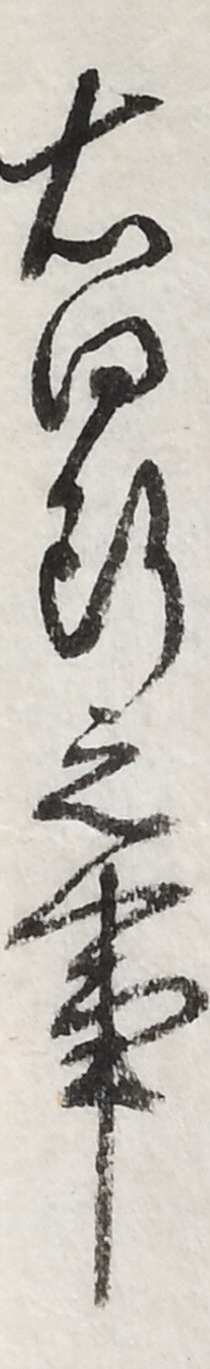右同断之事
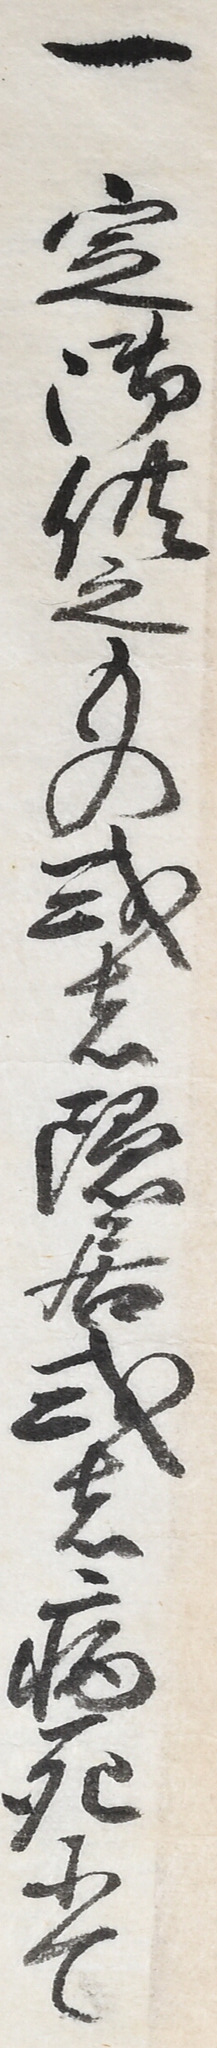一定御供之もの或は隠居或は病死にて
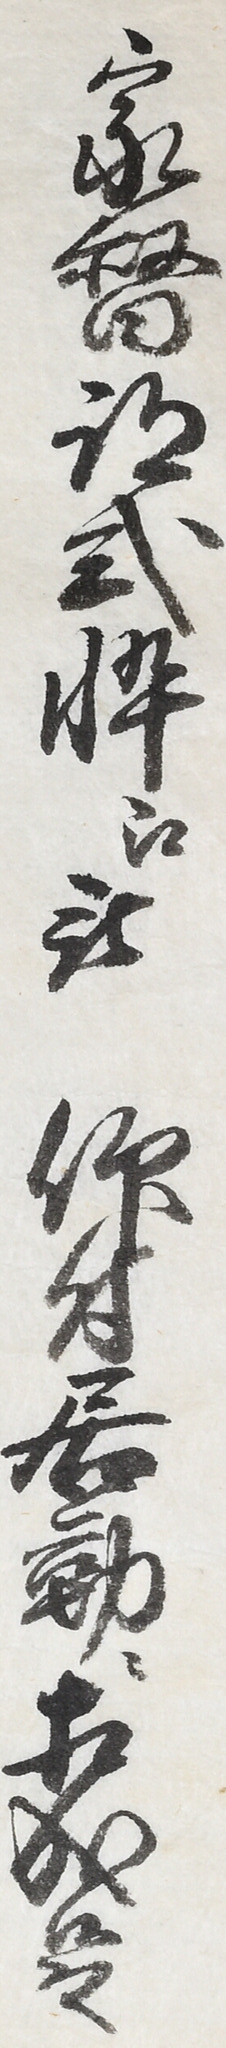家督跡式忰江被仰付居勤ニ相成候ハヽ
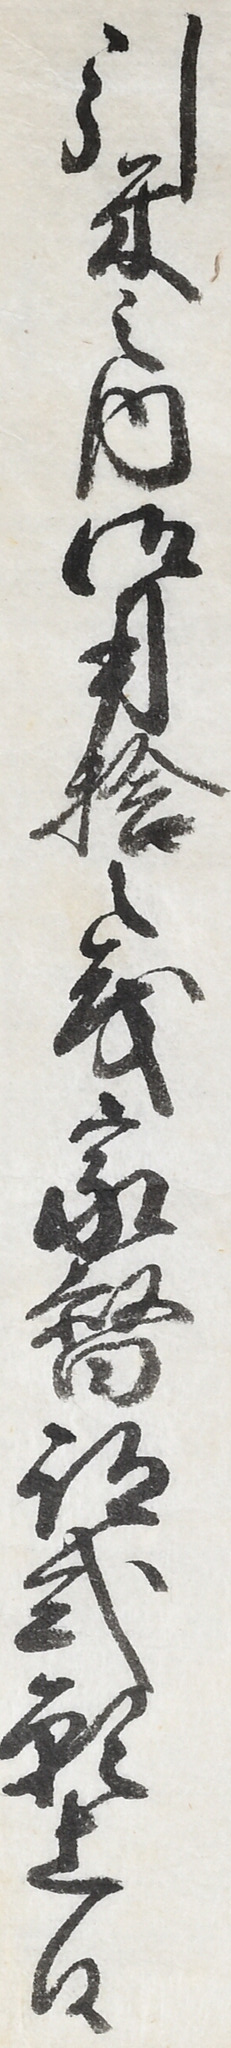引米之内御用捨之義家督跡式願上候
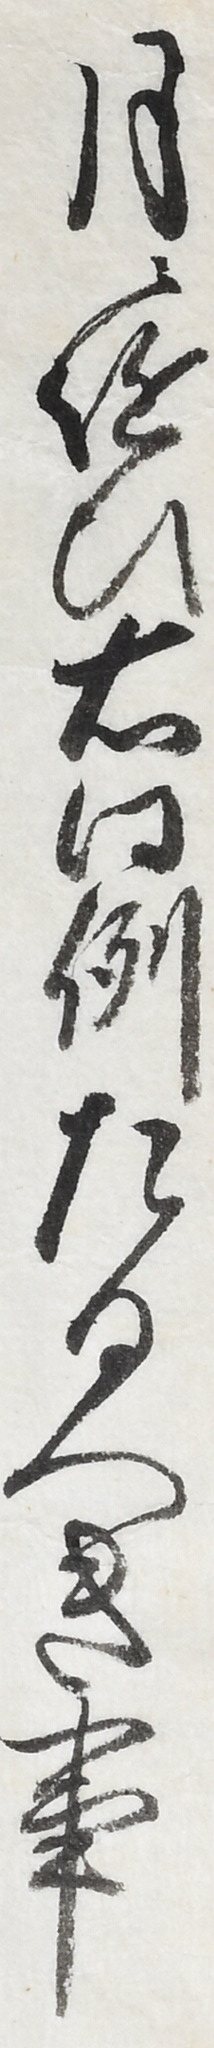月ニ随ひ右同例たるへき事
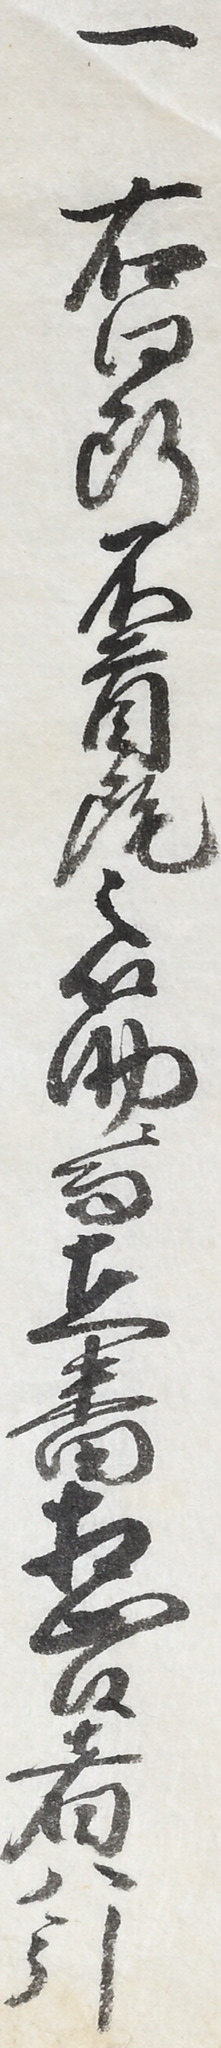一右同断不首尾之筋ニ而在番相止候者ハ引
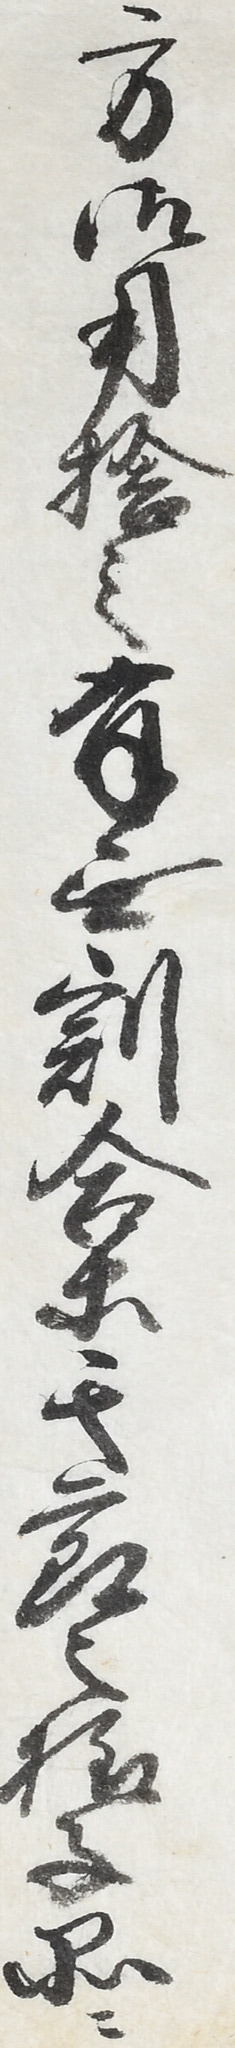方御用捨之有無割合等其節之様子品ニ
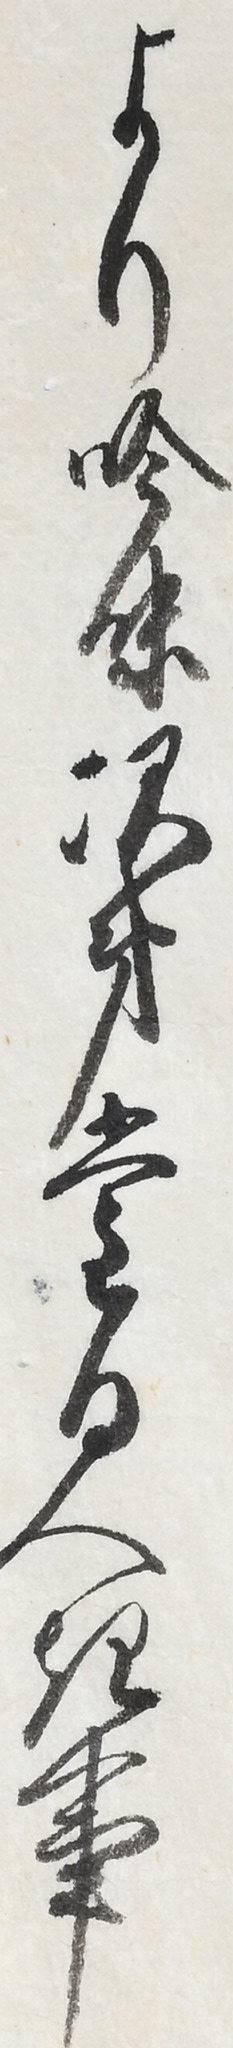より吟味次第たるへき事
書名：御給分渡り方定追加
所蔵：伊那市立高遠町図書館・合同会社AMANE
